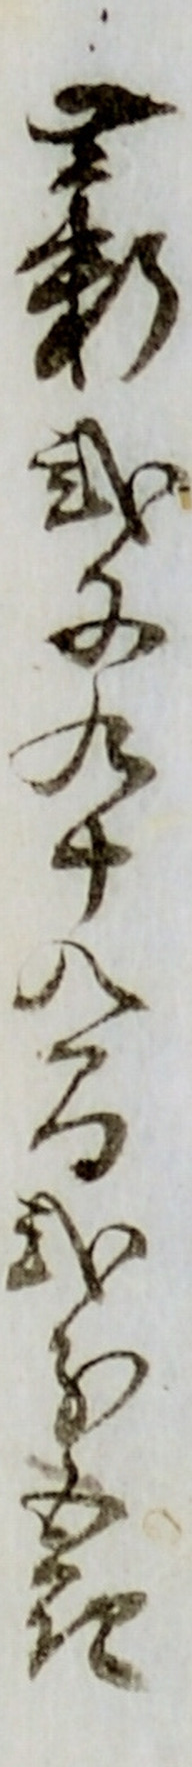薪弐千九十八間弐分五厘
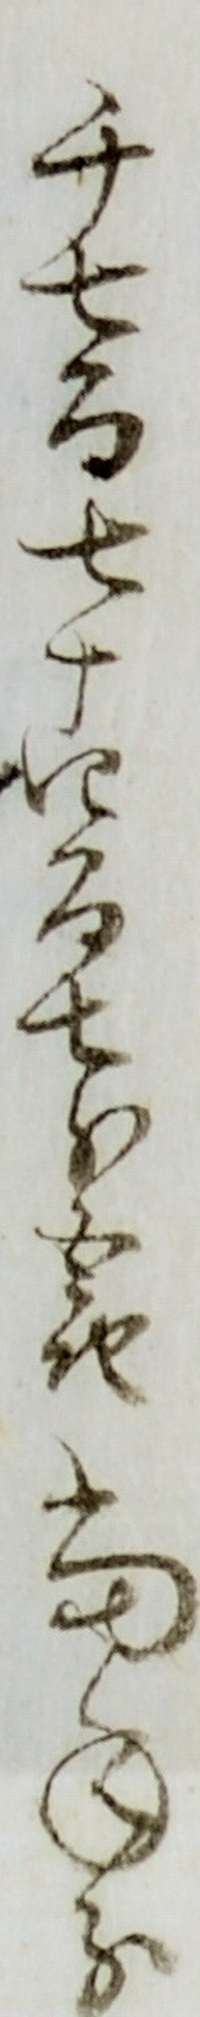千七百七十四間七分五厘当年分

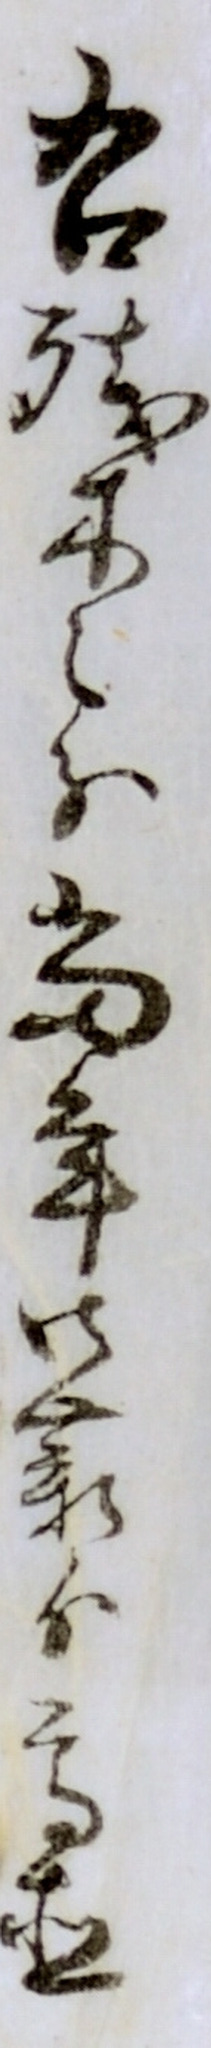右残木之分当年御薪ゟ高直
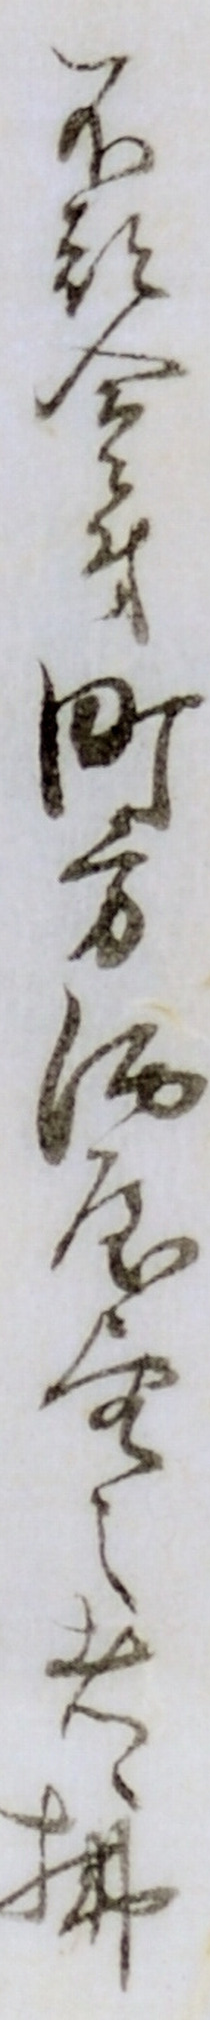不都合に付町方酒屋望之者へ払
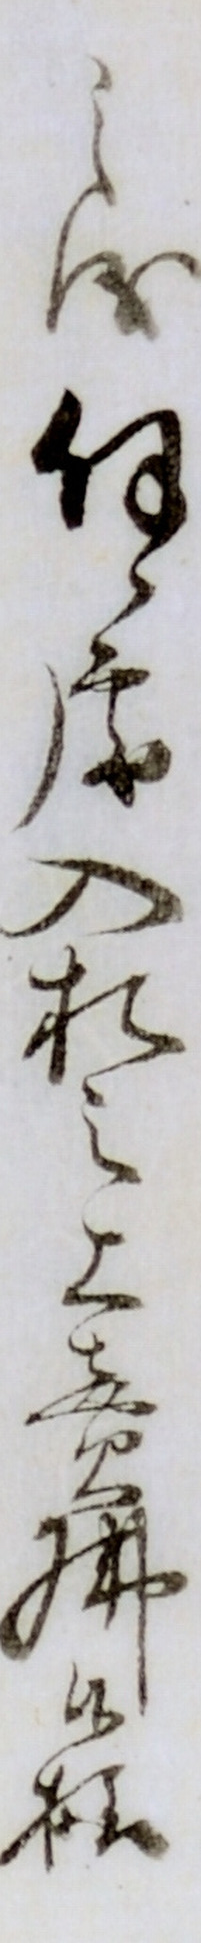之儀伺候処入札之上売払候様
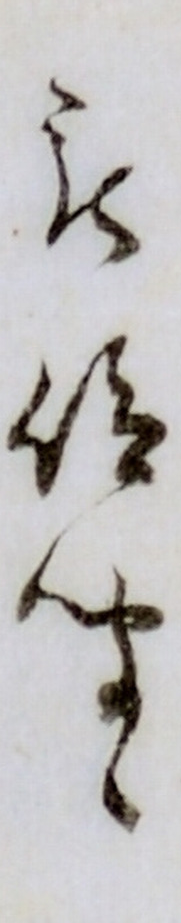被仰聞候
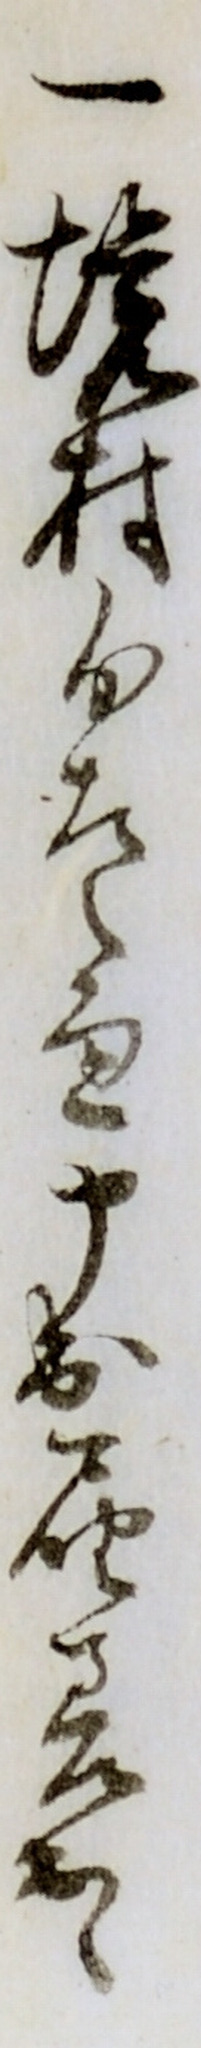一境村ゟ左之通申出届差出候
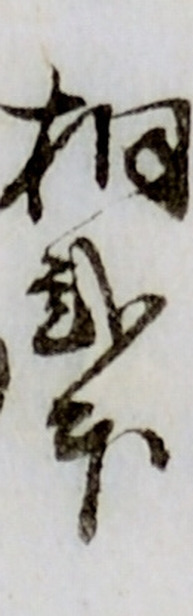桐弐本
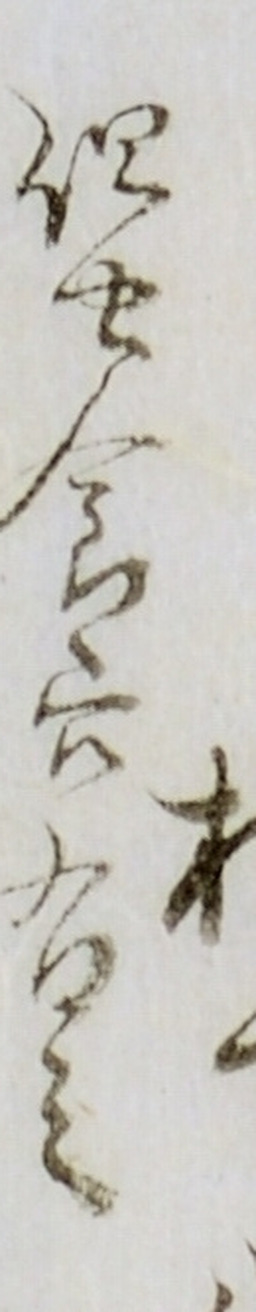但虫食穴有之
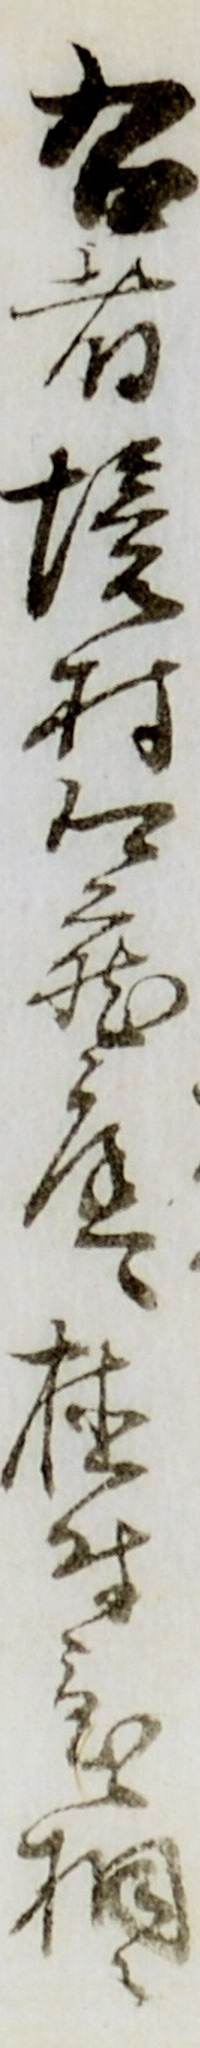右は境村郷蔵庭へ植付置候桐に
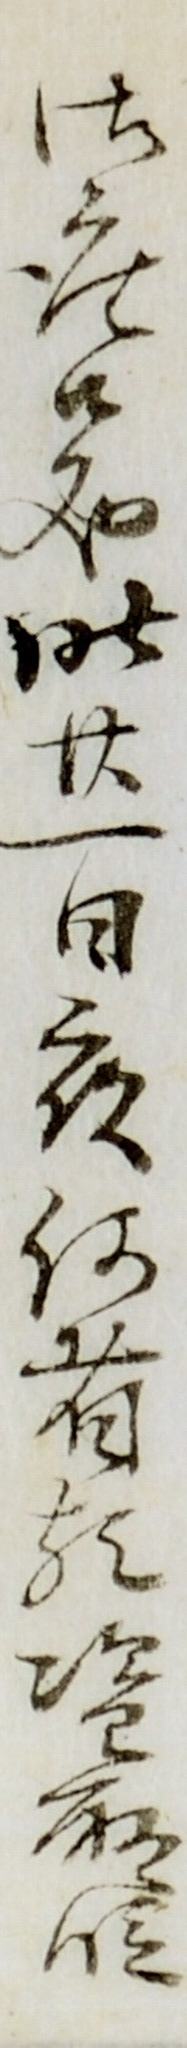御座候処昨廿一日夜何者歟盗取候段
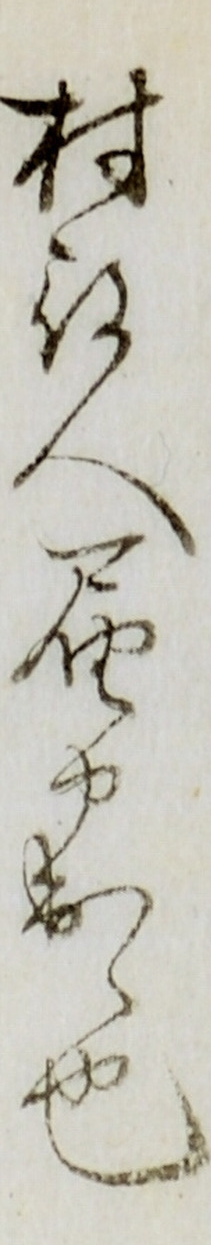村役人届申出候也
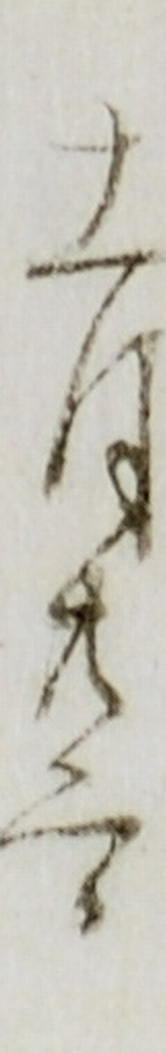十一月廿二日名
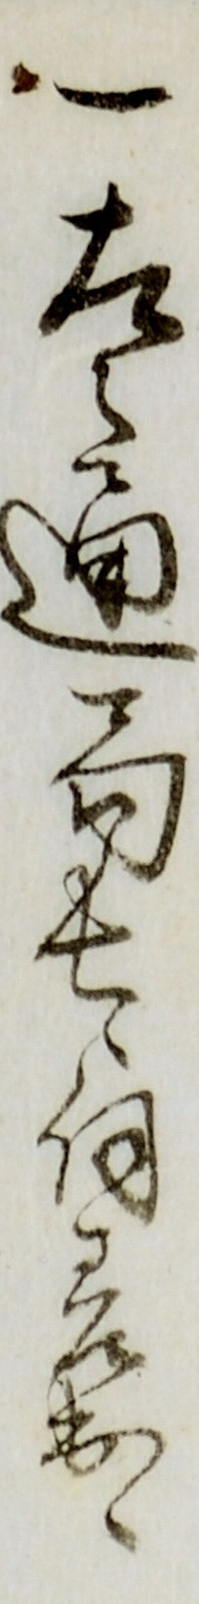一左之通局長へ伺差出候
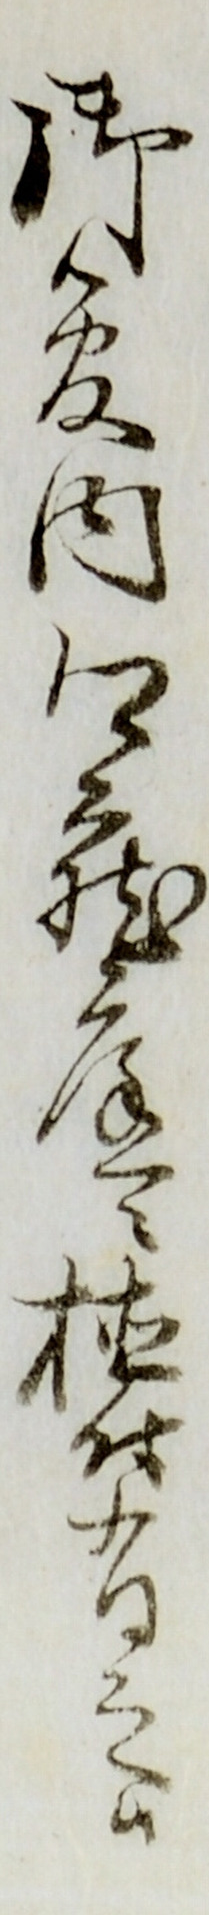御管内郷蔵庭に植付有之候
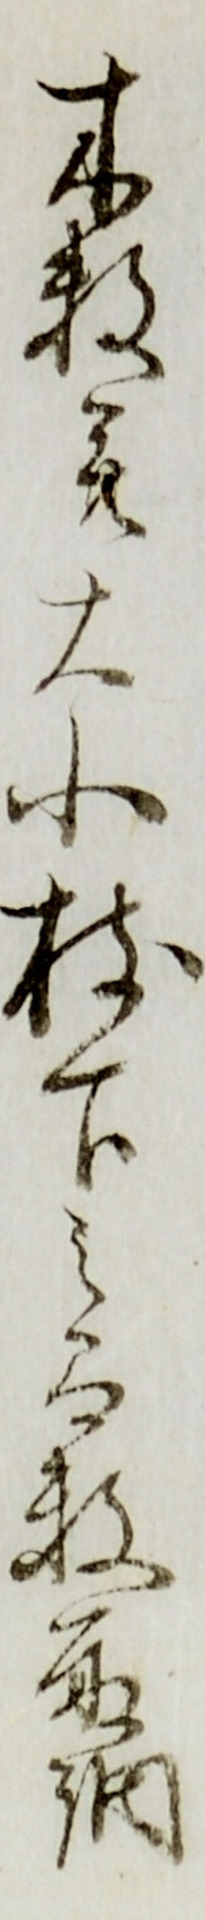木数幷大小枝下之間数取調
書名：山林方諸事御用留
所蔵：伊那市立高遠町図書館・合同会社AMANE
